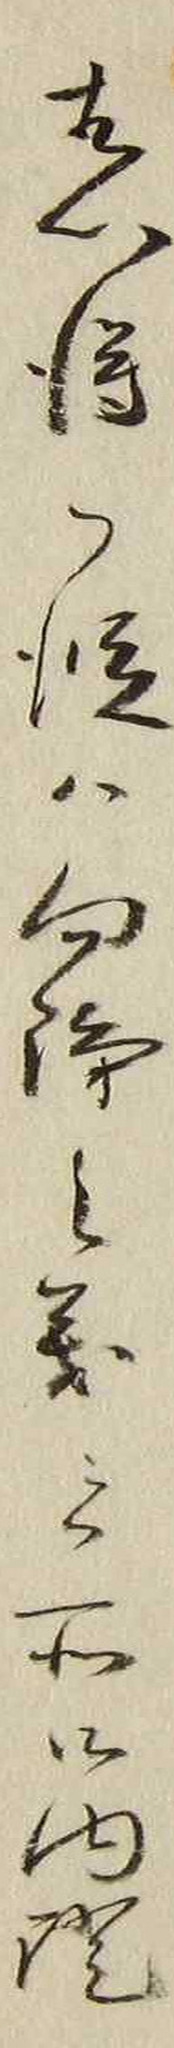相心得候段は勿論之義に候所御内証
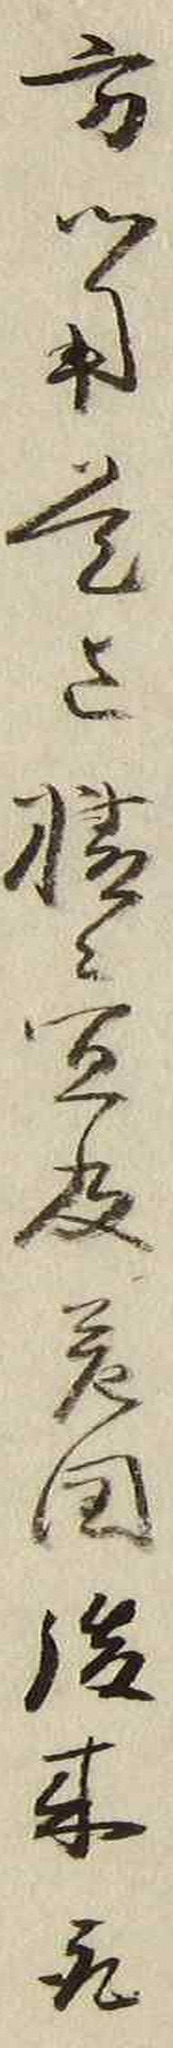方御用是迄精々宜及指図後來取
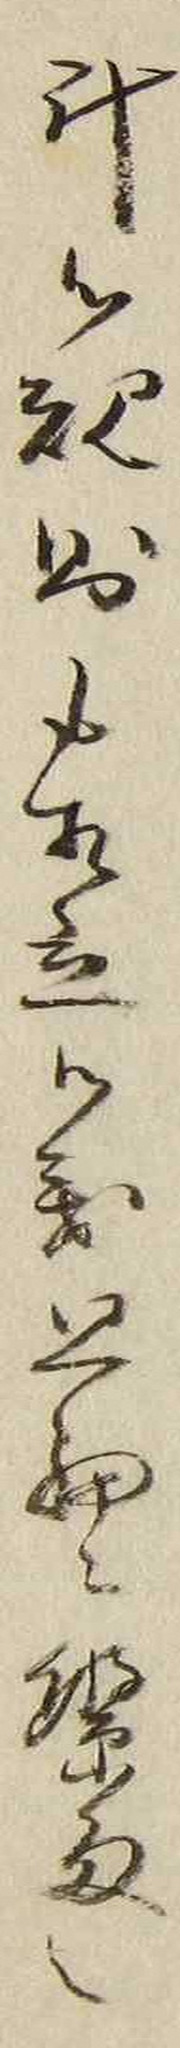計御規則も相立候義且細に繁多之

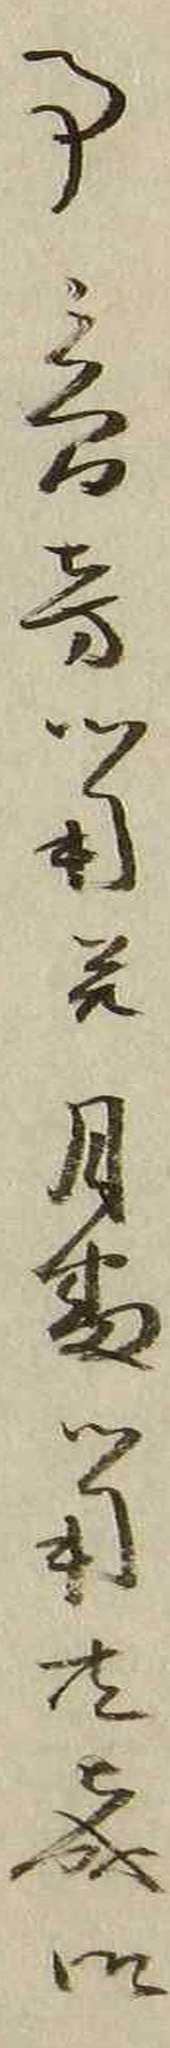事に候間旁御用并月番御用共被成御
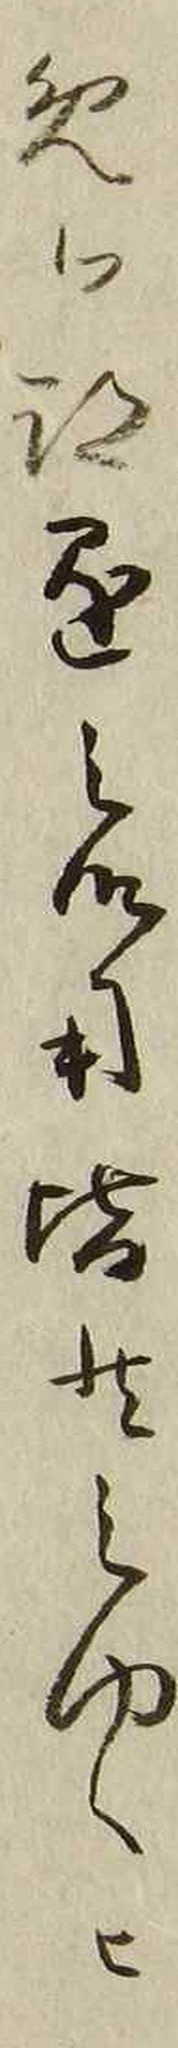免御跡懸之御用皆共之内へ被
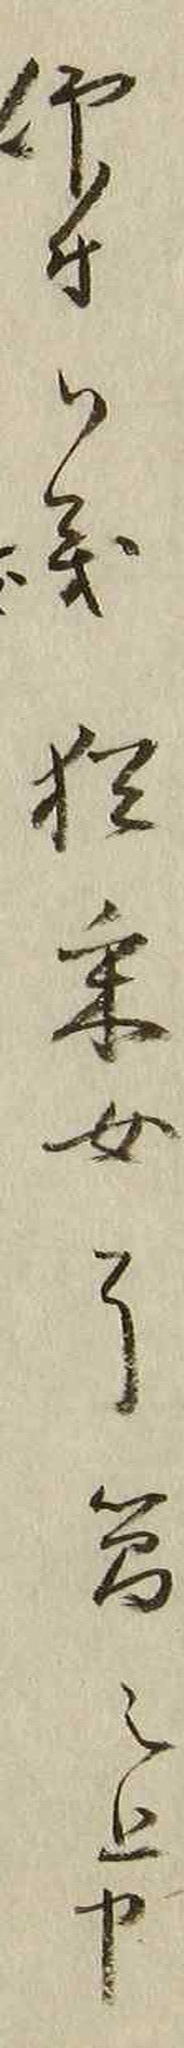仰付候義猶采女了簡之上申
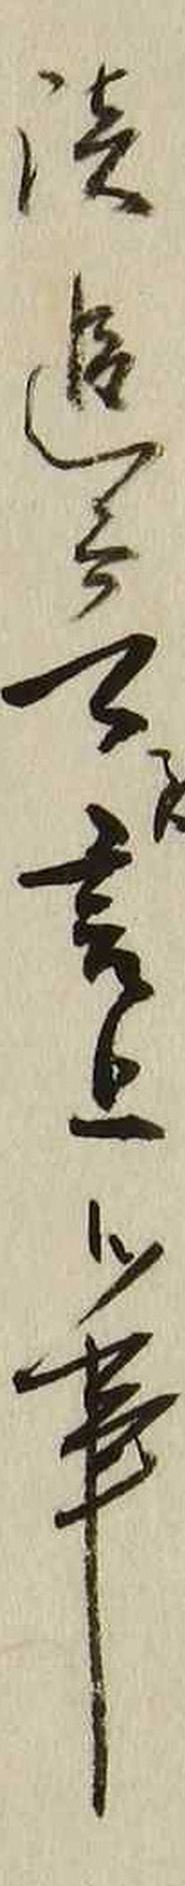談追而可致言上候事
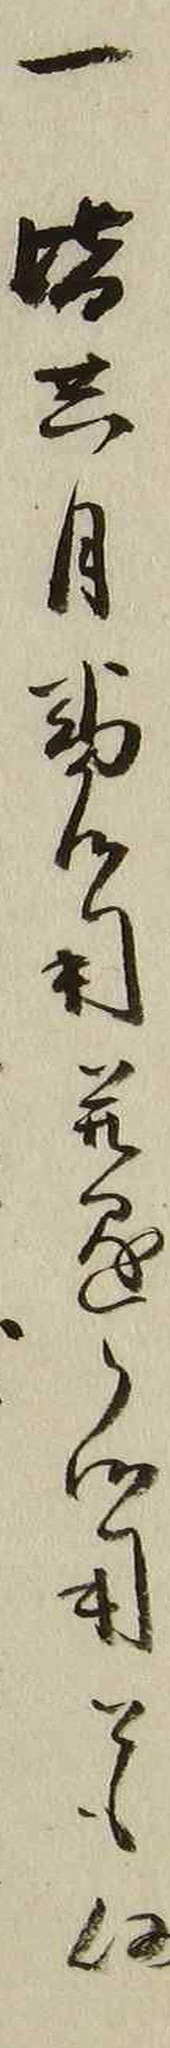一皆共月番御用并懸り御用とも何
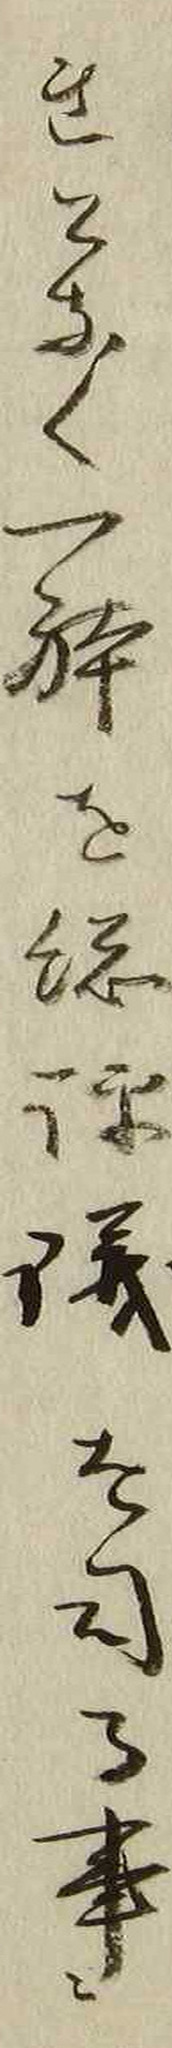れとなく一体を総評議を司る事に
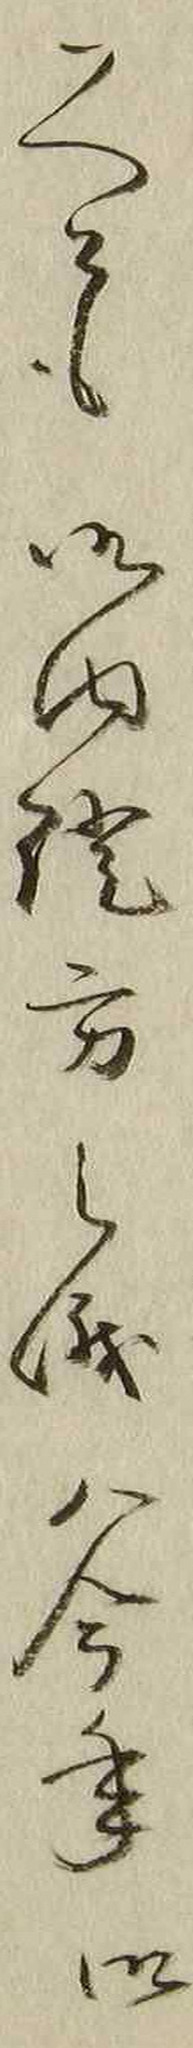候へとも御内証方之儀は今年御
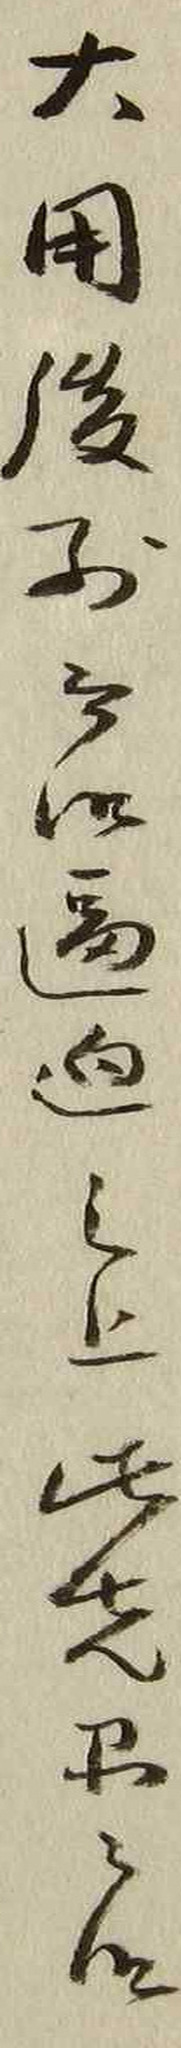大用後別而御逼迫之上此先品々御
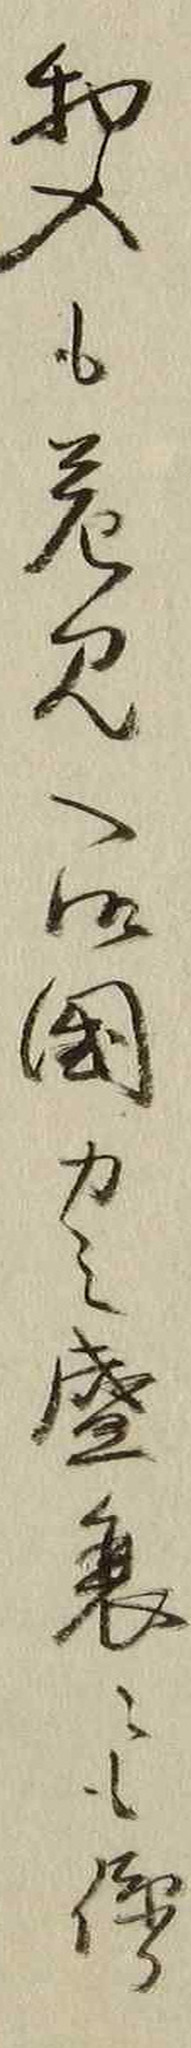物入も差見へ御国力之盛衰にも係り
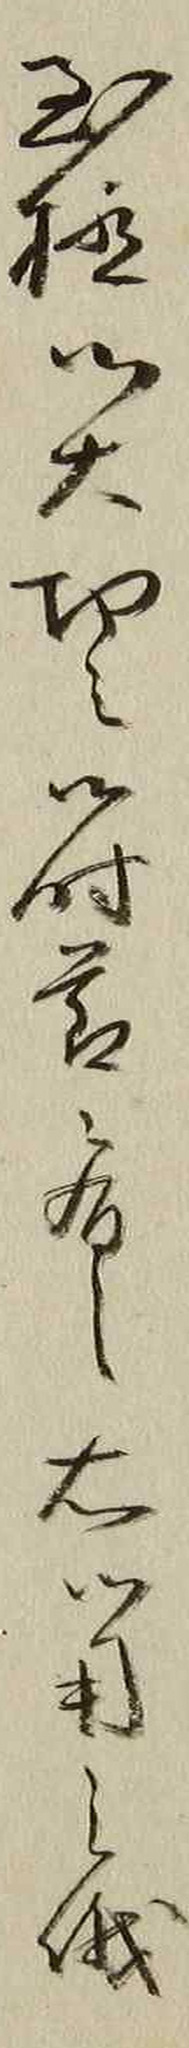至極御大切之御時節に有之右御用之儀
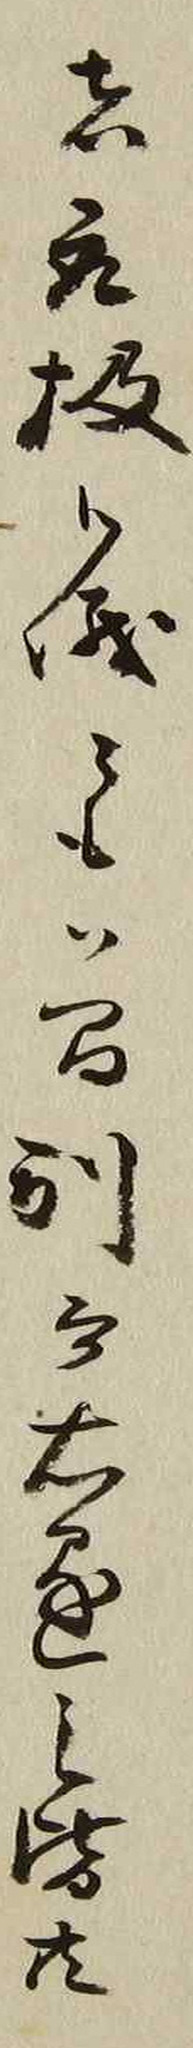は取扱候儀にも候間別而右懸之皆共
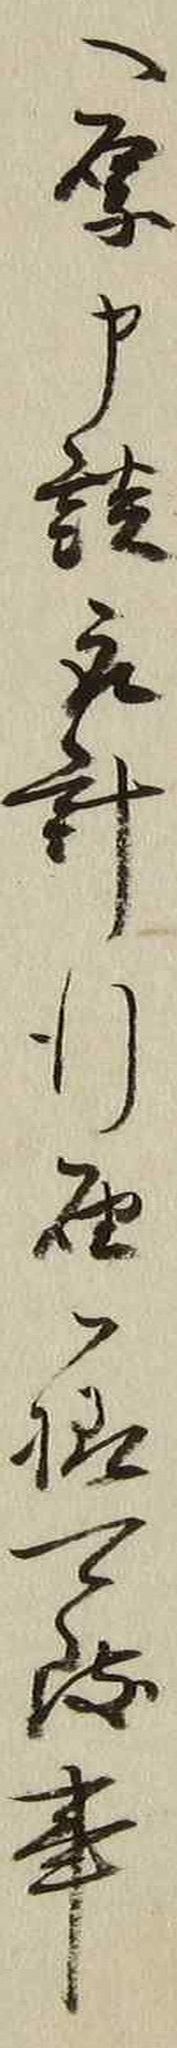へ厚申談取計行届候様可致事
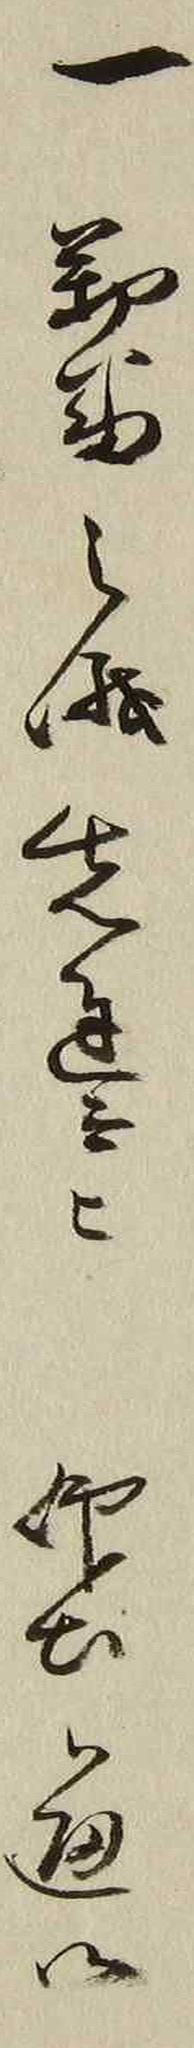一勤番之儀先達而被仰出候通御
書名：諸士系譜　巻之292　き之部1
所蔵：会津若松市立会津図書館
